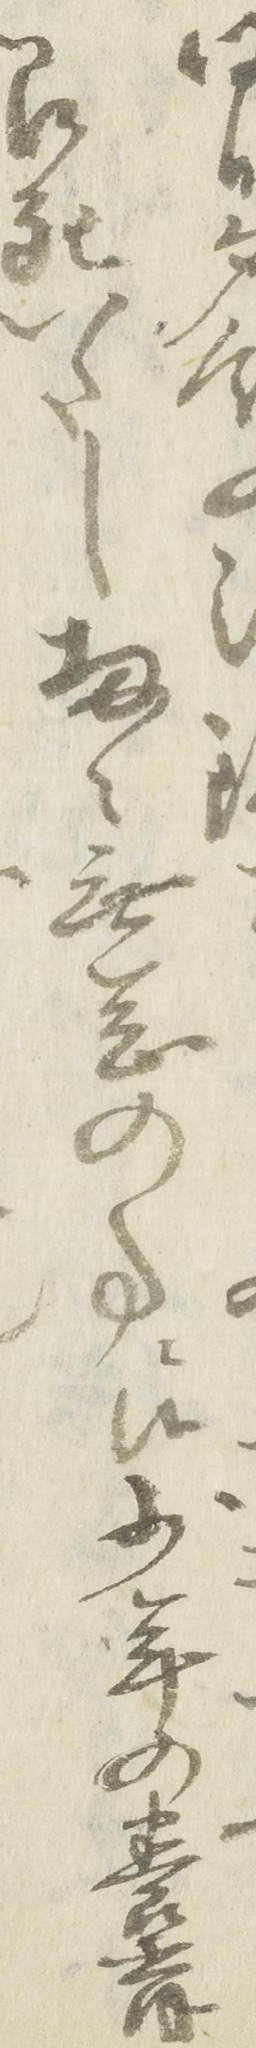即死いたし扨〻無念の事ニ候少年の養育
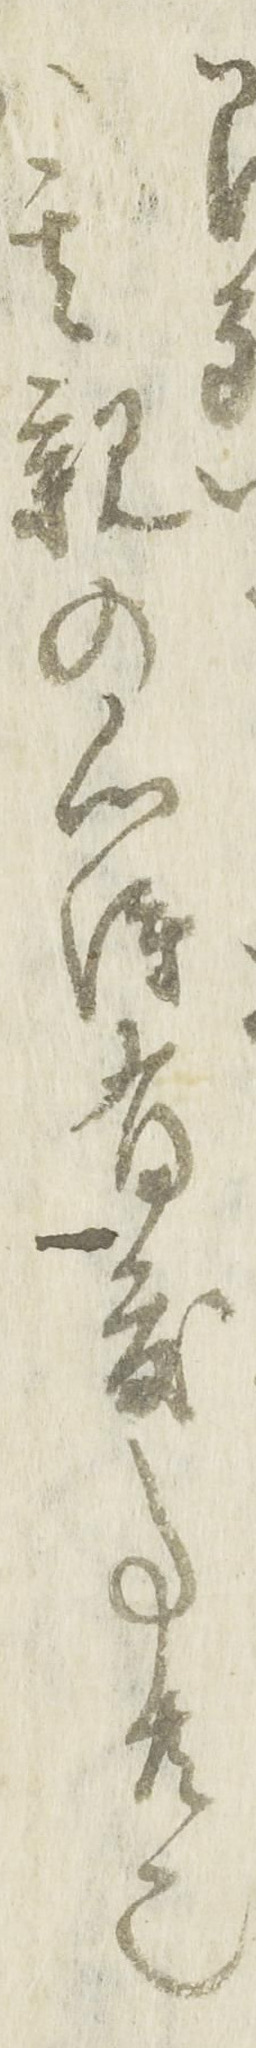は其親の心得有度事共也
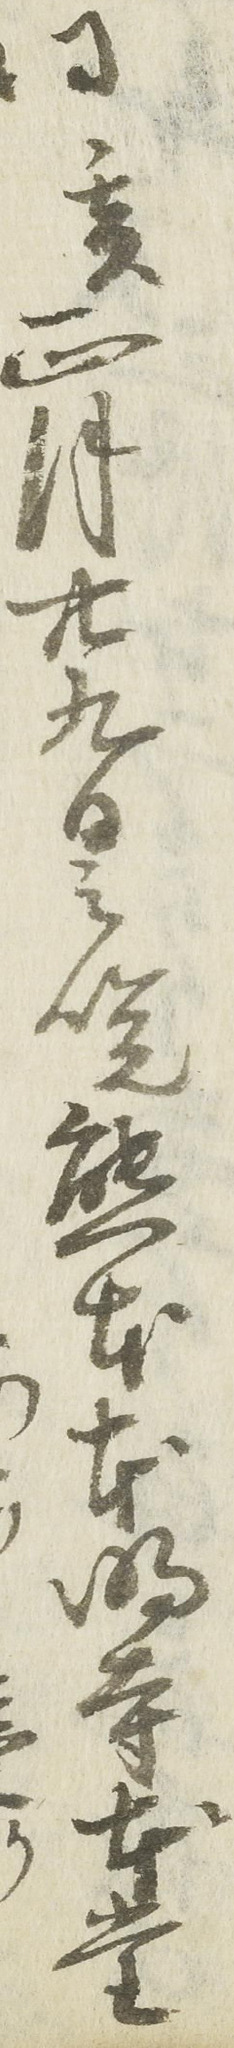一同亥正月廿九日之晩熊本本明寺本堂
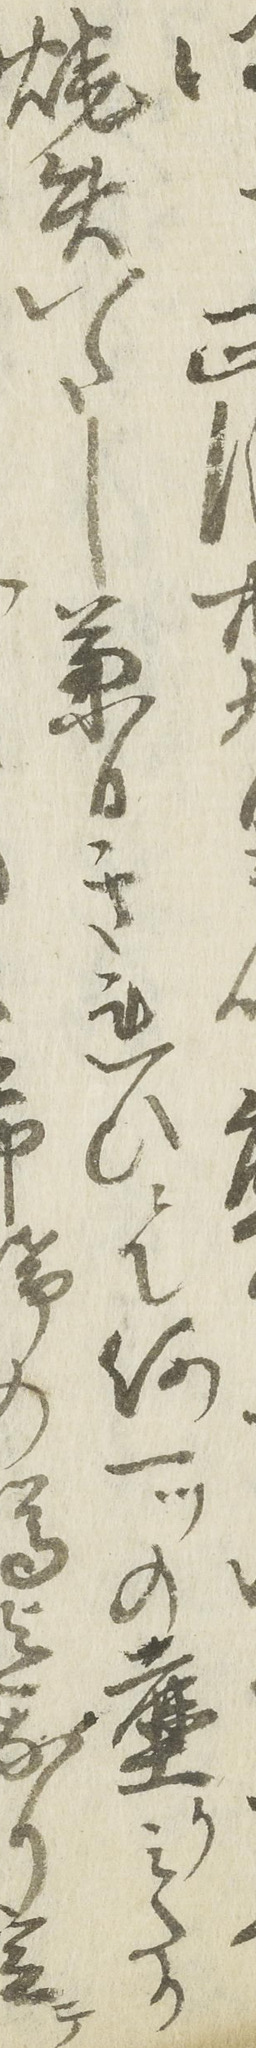焼失いたし兼日きれひニて何一ツの塵りみたり
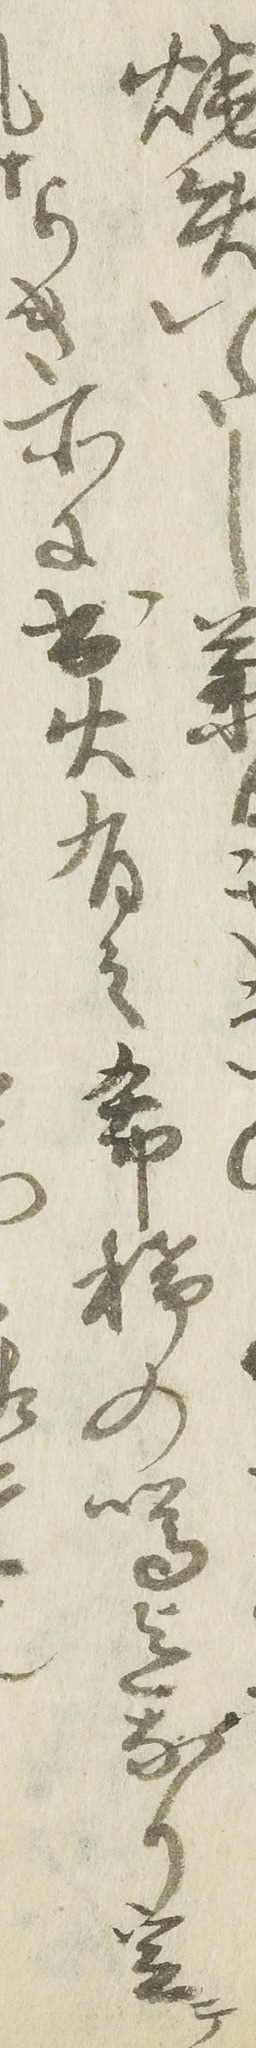もなき所に出火有之希稀の噂迄なり定テ
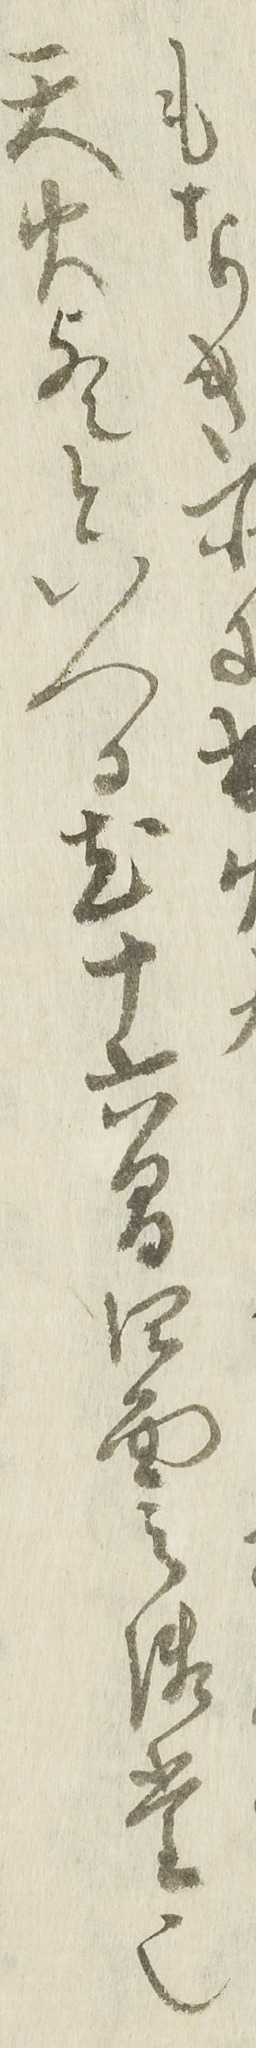天火歟といへる尤十六間四面之御堂也
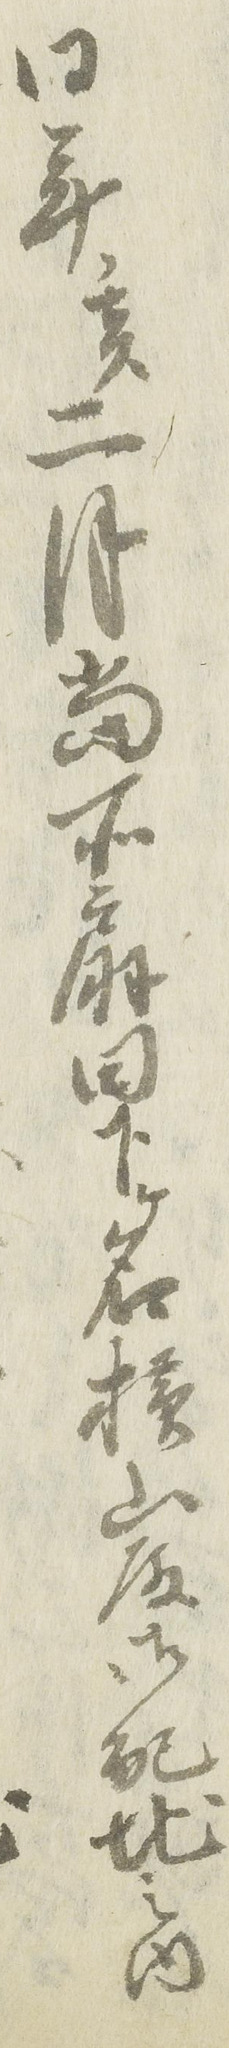一同年亥二月当所扇田下ケ名横山殿御配地之内
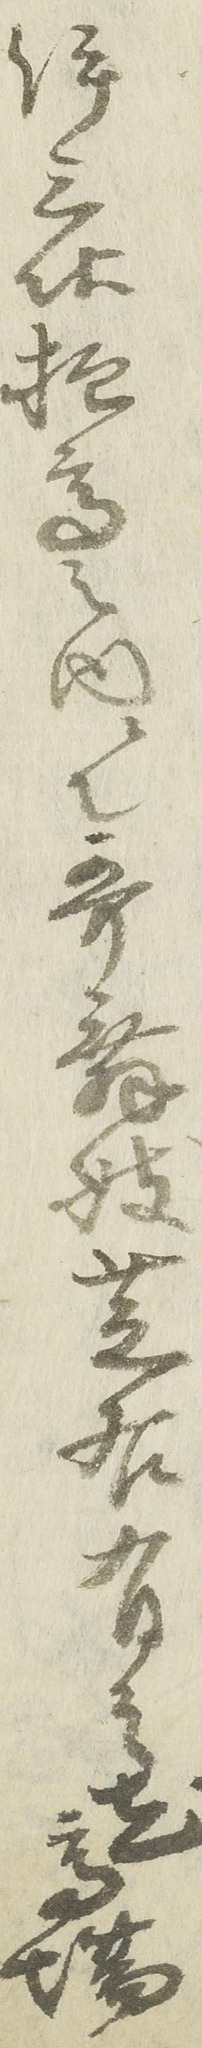伊三次抱高之内ニて歌舞妓芝居有之尤高場
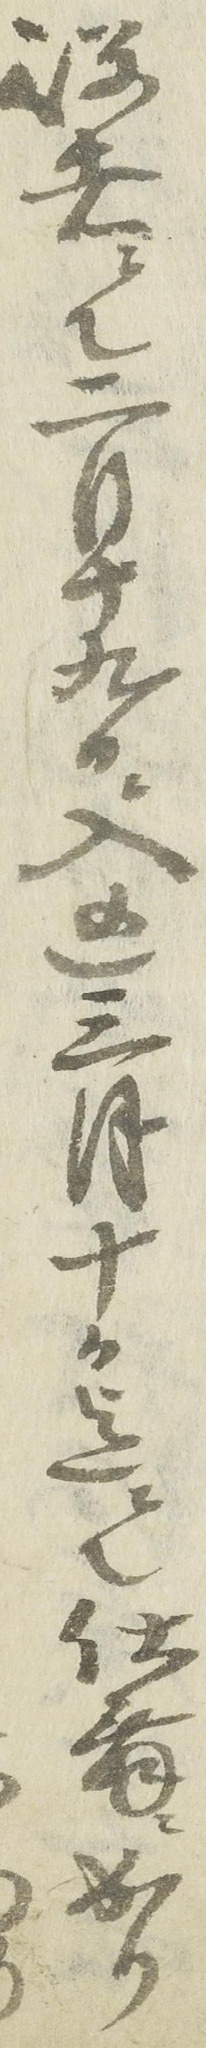役者ニて二月十九日ニ入込三月十日迄ニて仕舞ニ成り大当り

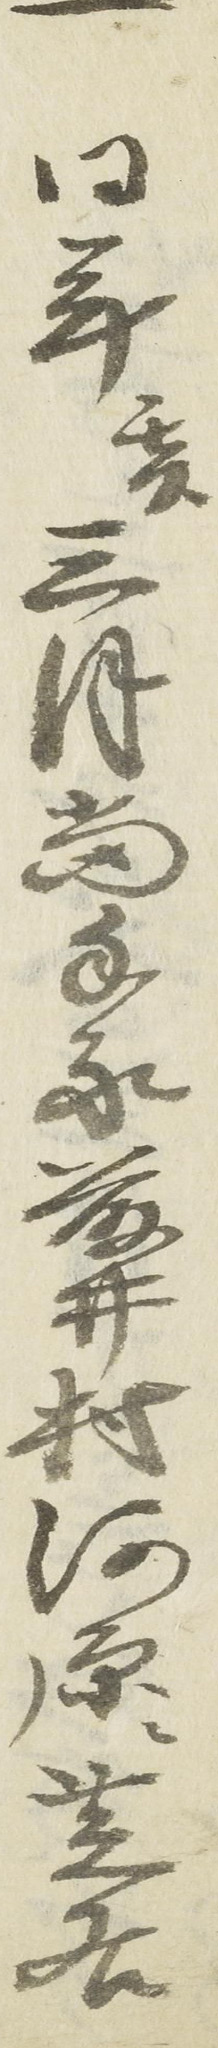一同年亥三月当手永藤井村河原ニ芝居
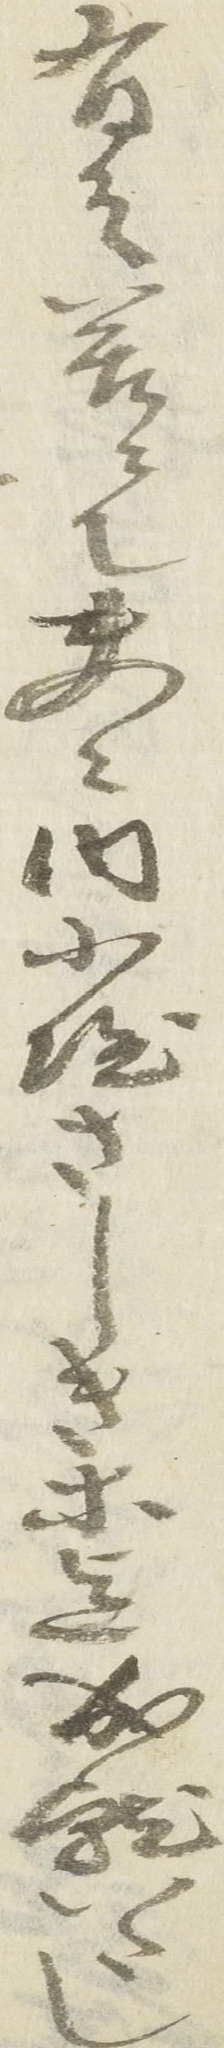有之筈にて夫〻内小屋さしき等迄成就いたし
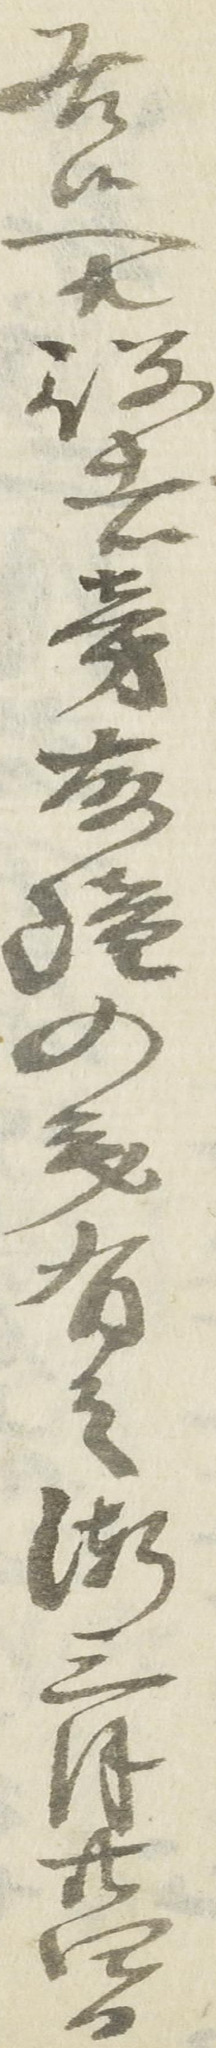居候へ共役者旁故障の義有之漸三月廿四日
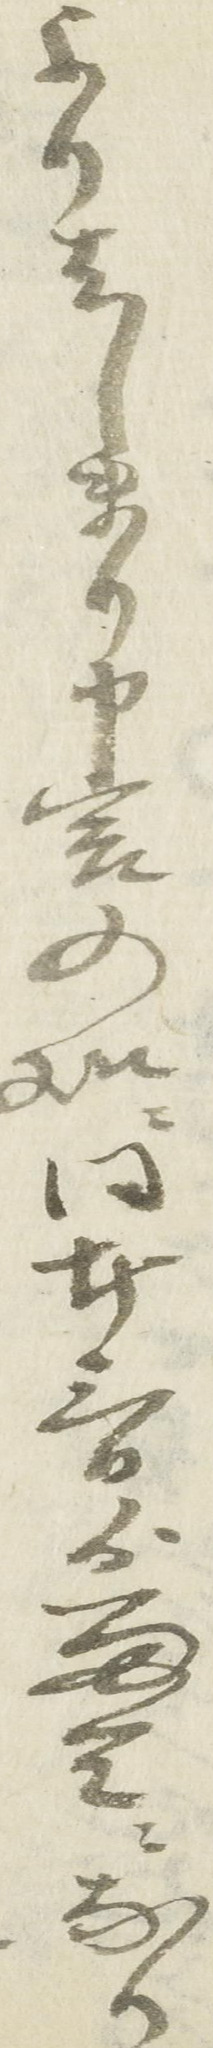よりはしまり申筈の処ニ同廿三日ゟ雨天ニなり
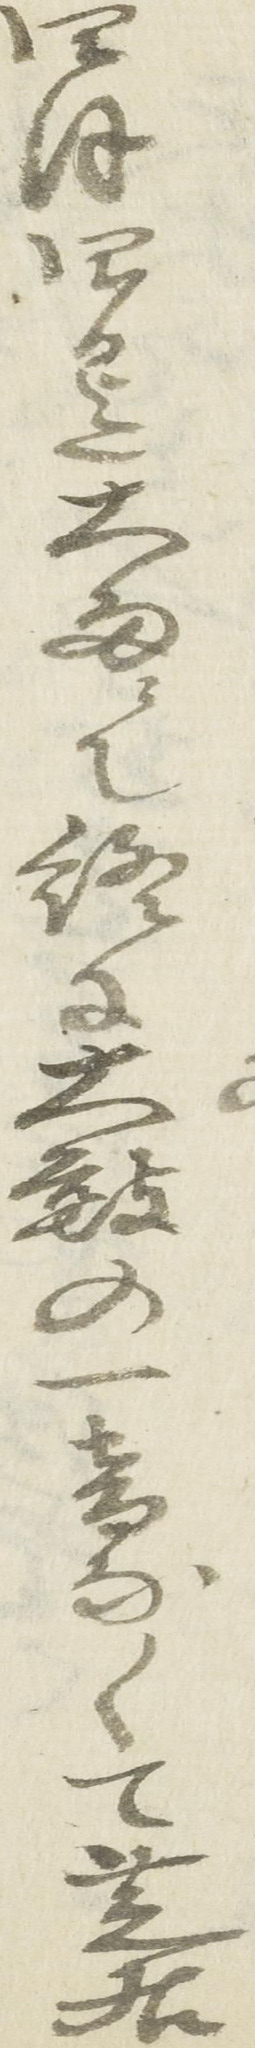四月四日迄大雨ニて終に大鼓の一音なくて芝居
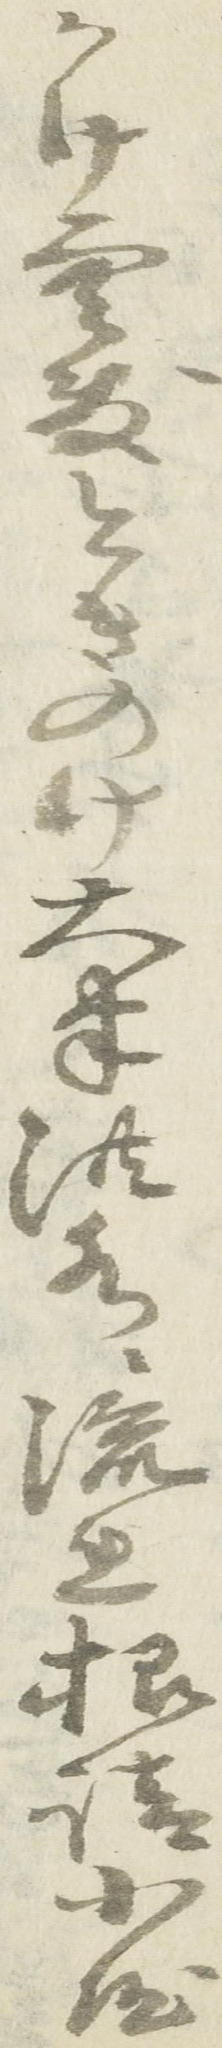かけま敷ときのけ大半洪水ニ流れ根請小屋
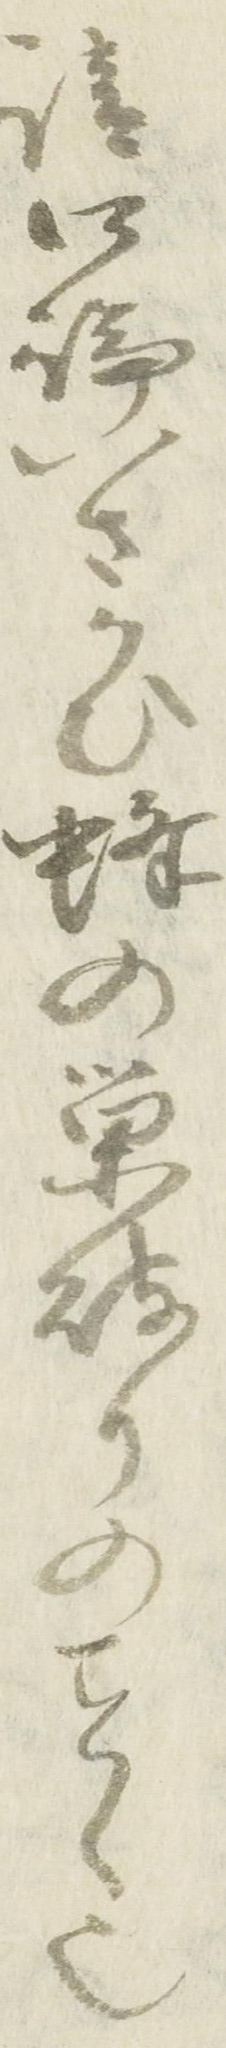請口論いさかひ蜂の巣破りのことく也
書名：後見笑
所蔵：東京大学地震研究所図書室 Earthquake Research Institute Library, The University of Tokyo, JAPAN
